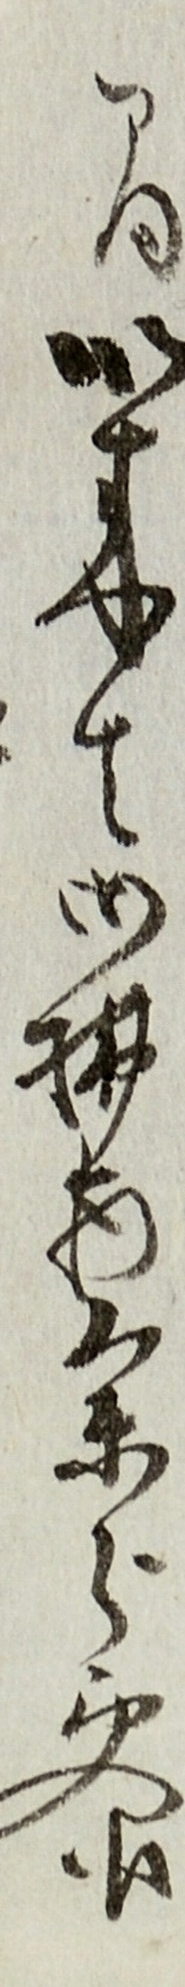間以来者御払物余分受取
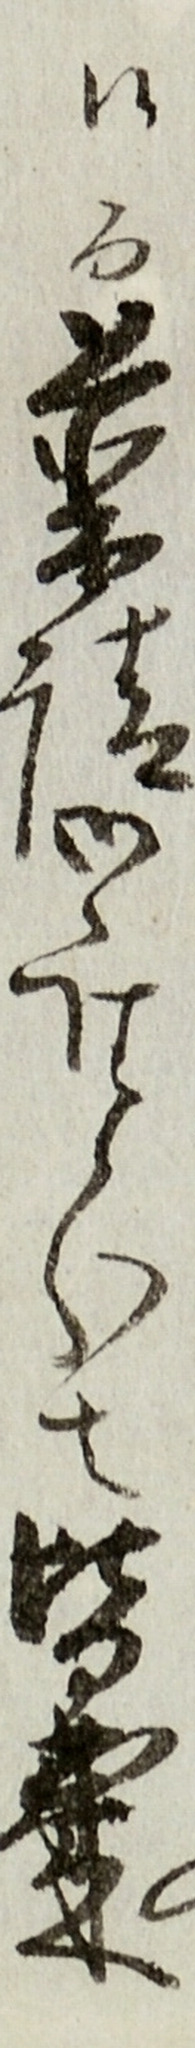候而普請御座候分者皆
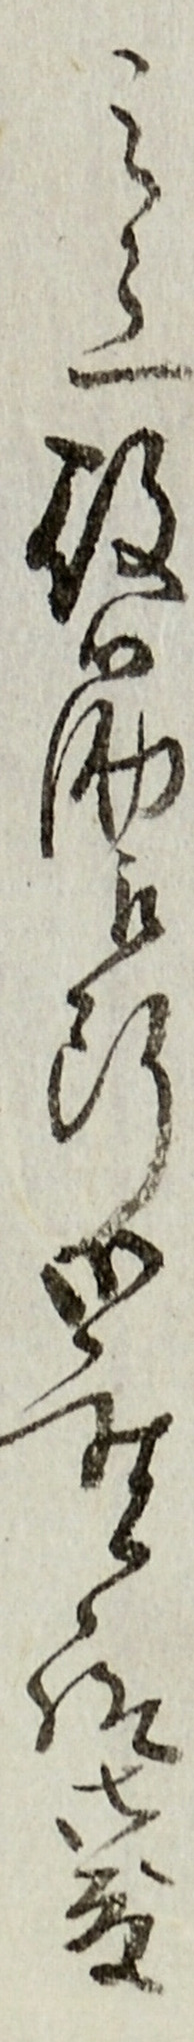之上役筋江断御座候様此度
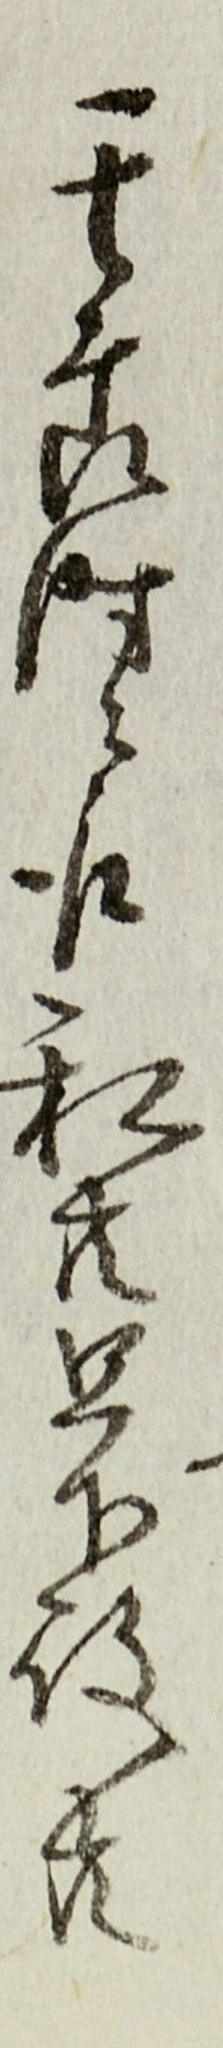其節時々江私共且下役共
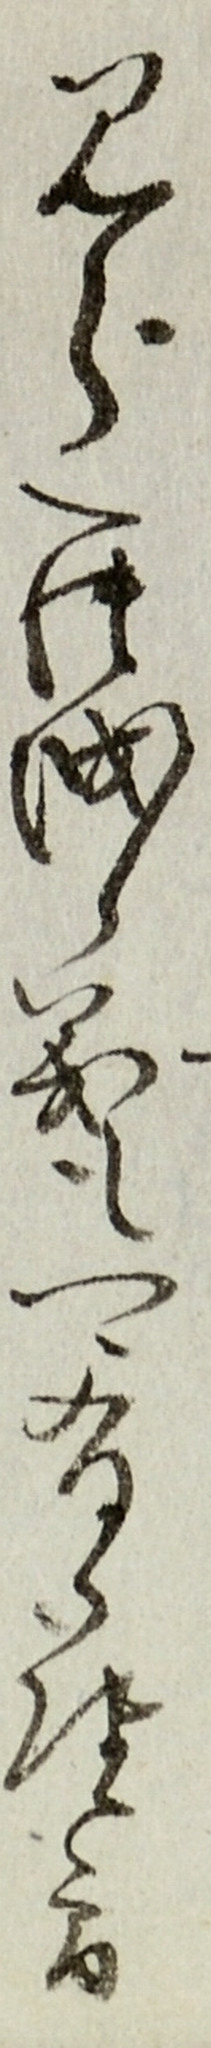見分罷越候義も可有御座候間
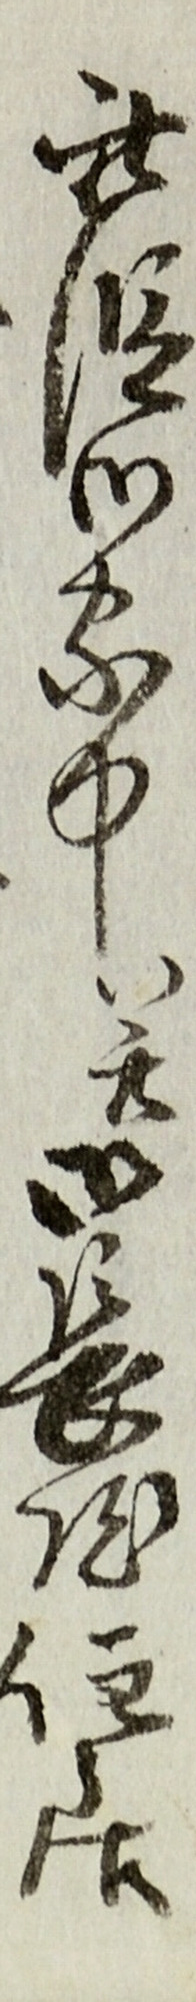此段御家中并御長屋住居
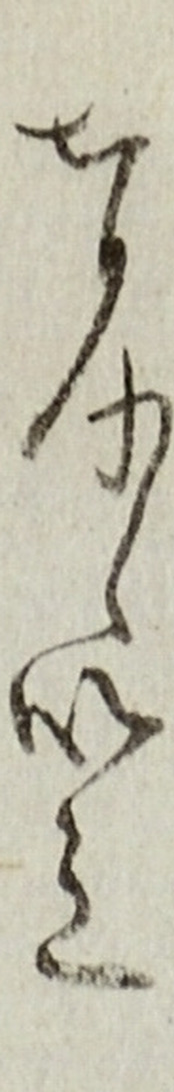奉存候以上
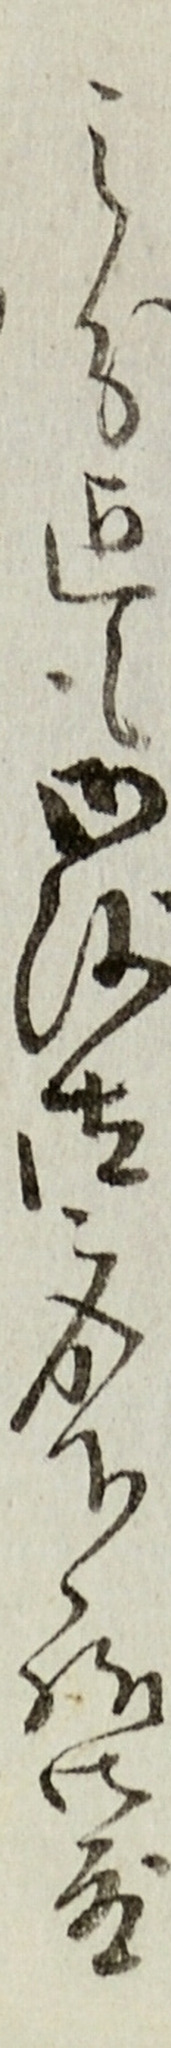之分迄も御沙汰被成下候様此度
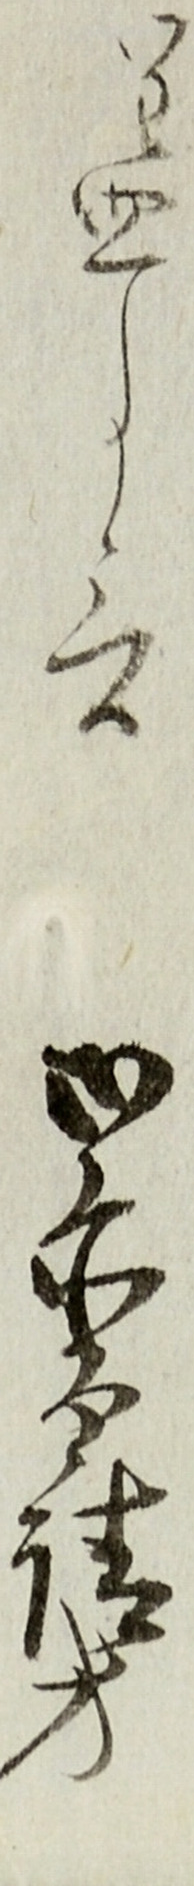閏四月三日御普請方
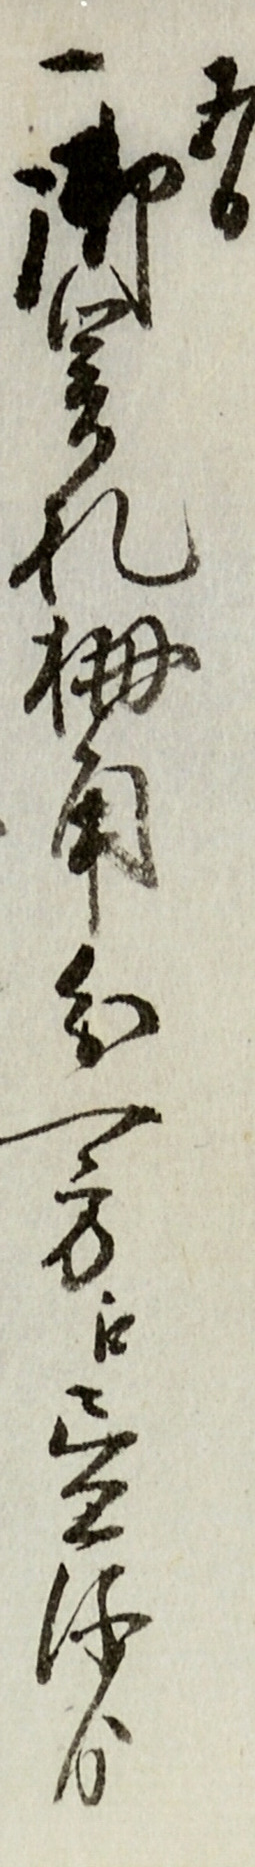一御関札栂角分一方江昼後ゟ
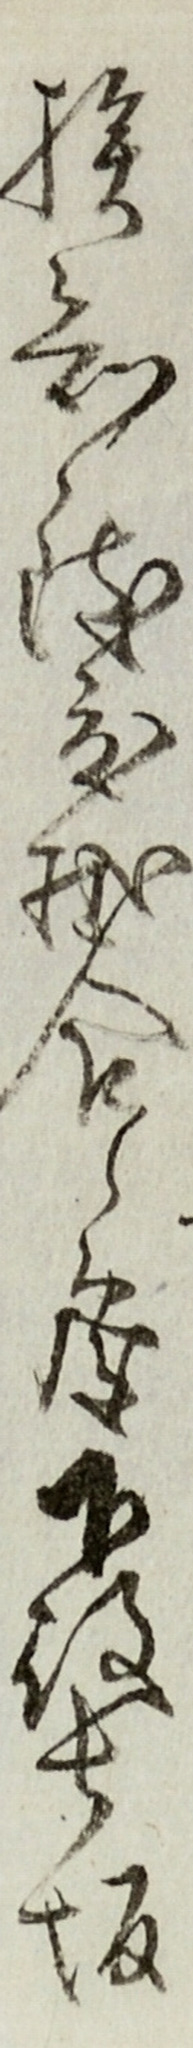検知致度掛合候処下役長坂
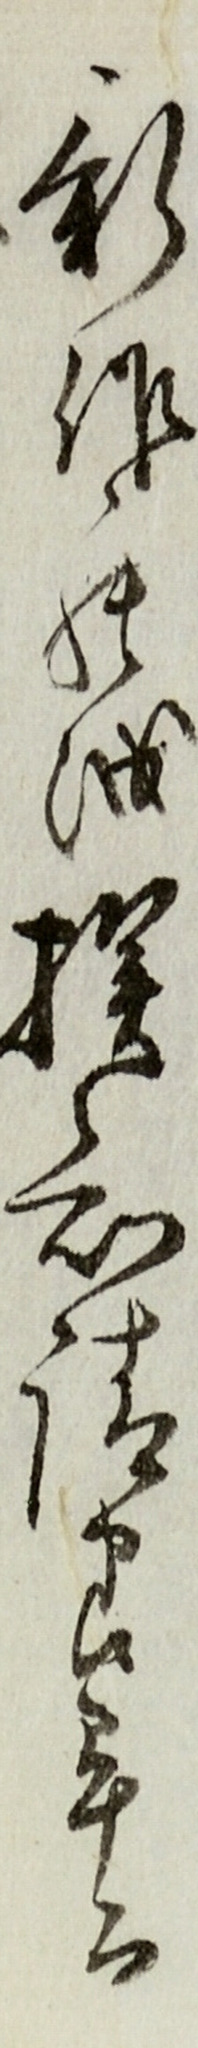新作罷越検知請申候畢而
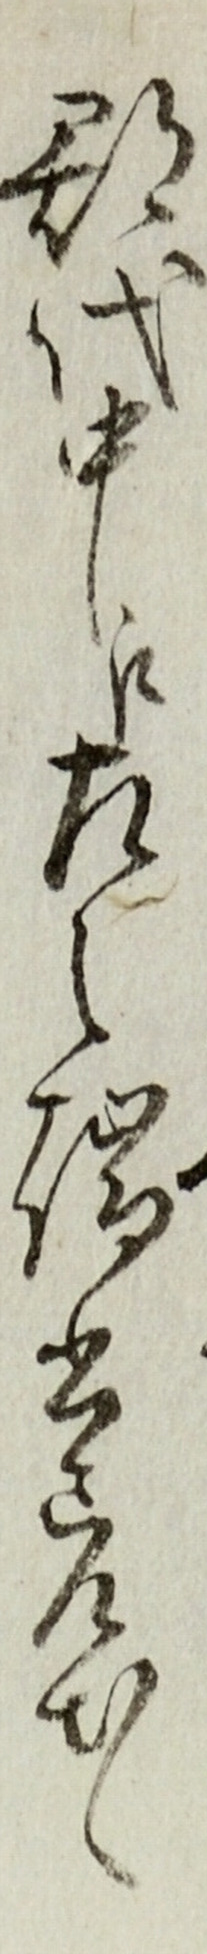郡代中江左之端書差出候
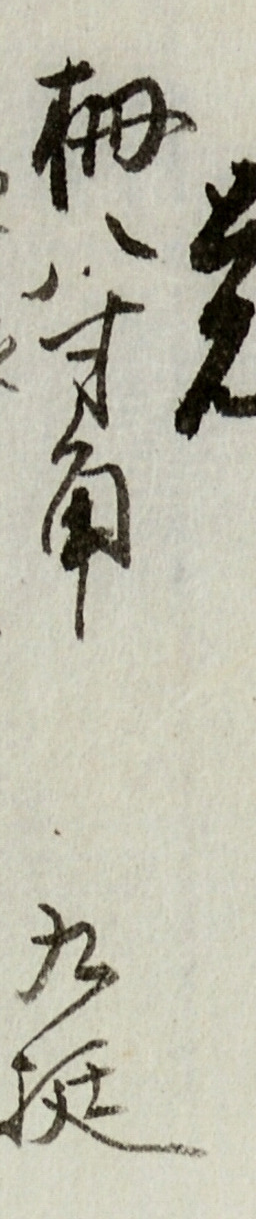栂八寸角九挺
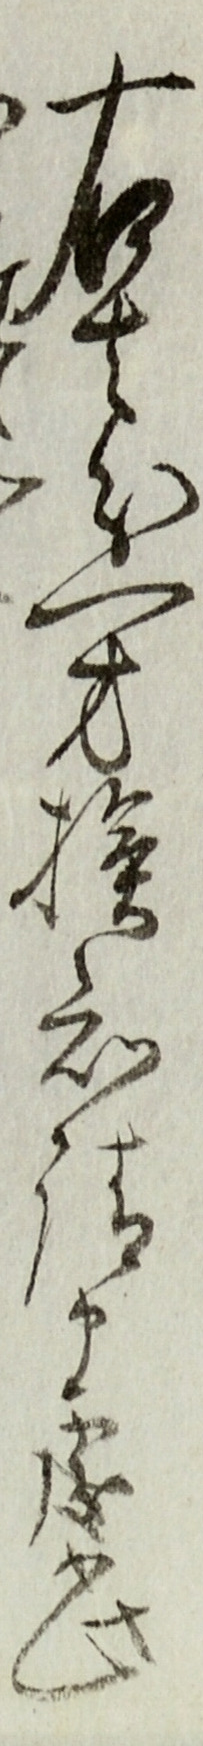右者分一方検知請申処如此
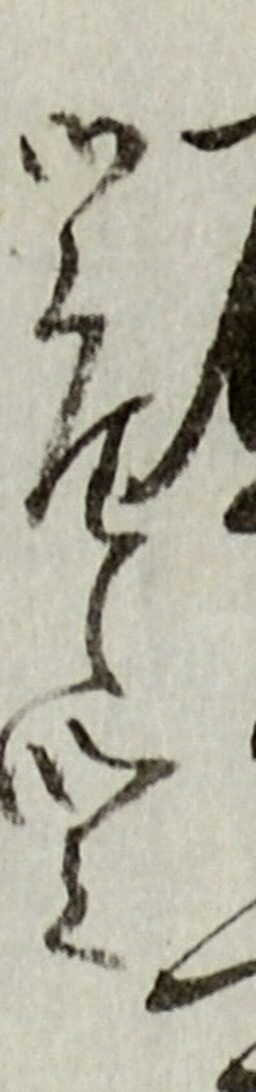御座候以上
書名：御山方御薪方諸事御用留
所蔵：伊那市立高遠町図書館・合同会社AMANE
